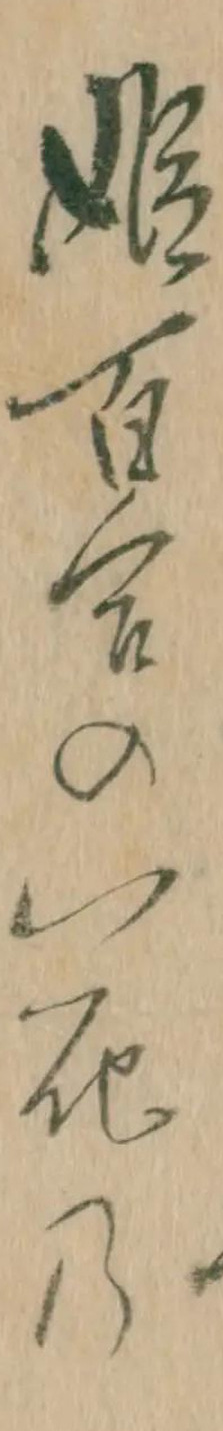姫百合の花の
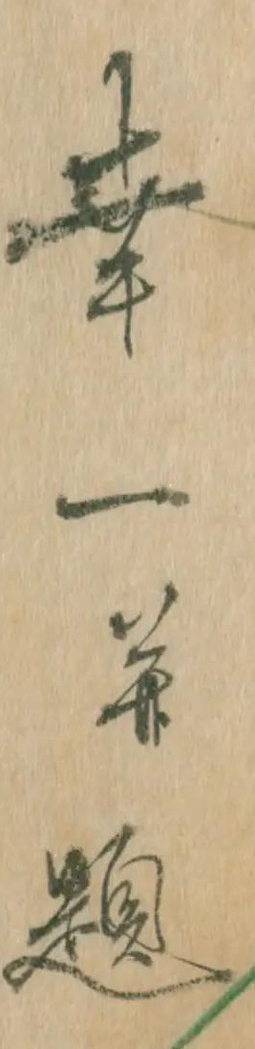幸一并題
